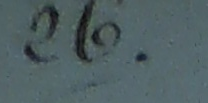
26.
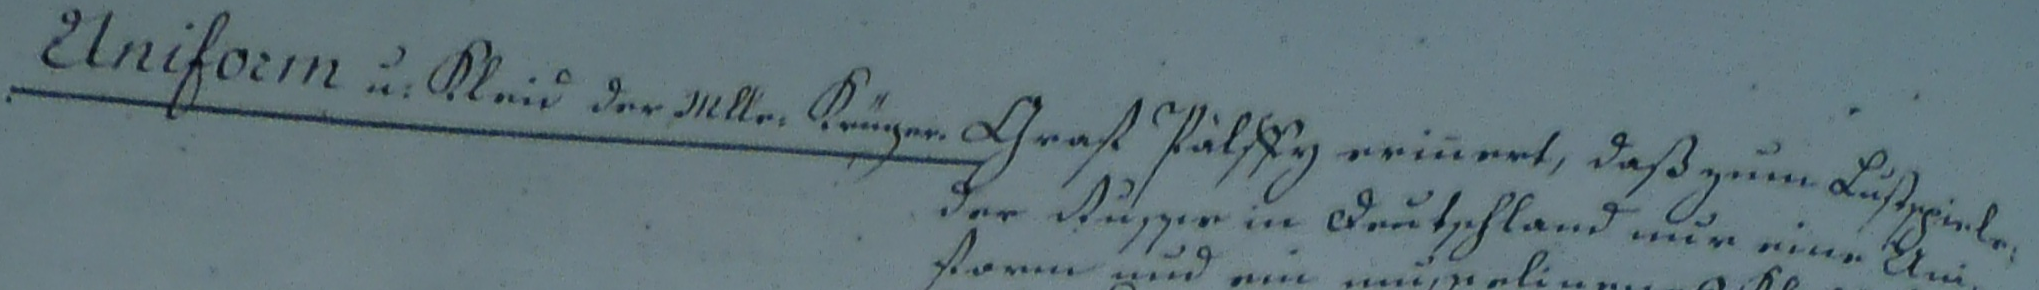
Uniform u: Kleid der Mlle: Krüger. Graf Pàlffy erin̅ert, daß zum Lustspiele:
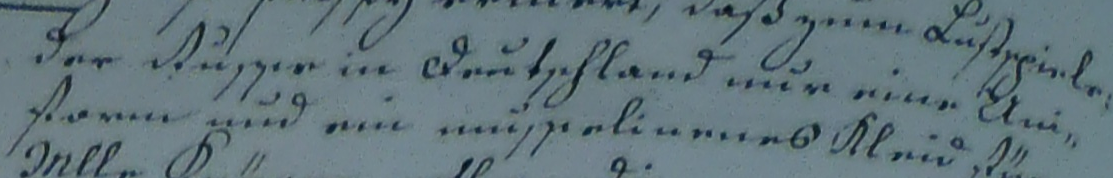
der Russe in Deutschland nur eine Uni¬
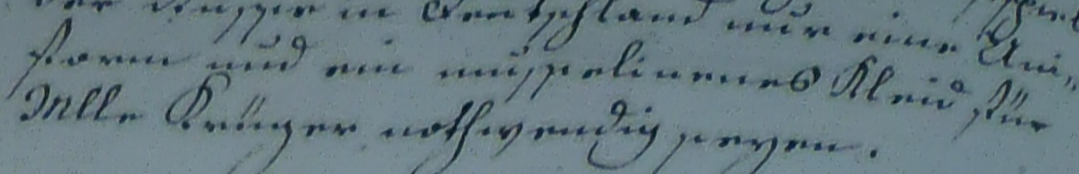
form und ein musselinenes Kleid für
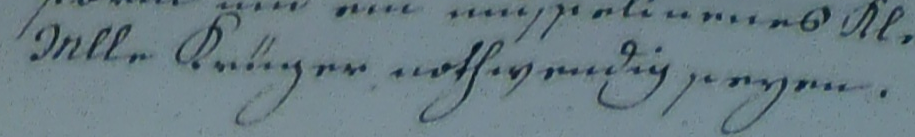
Mlle Krüger nothwendig seyen.
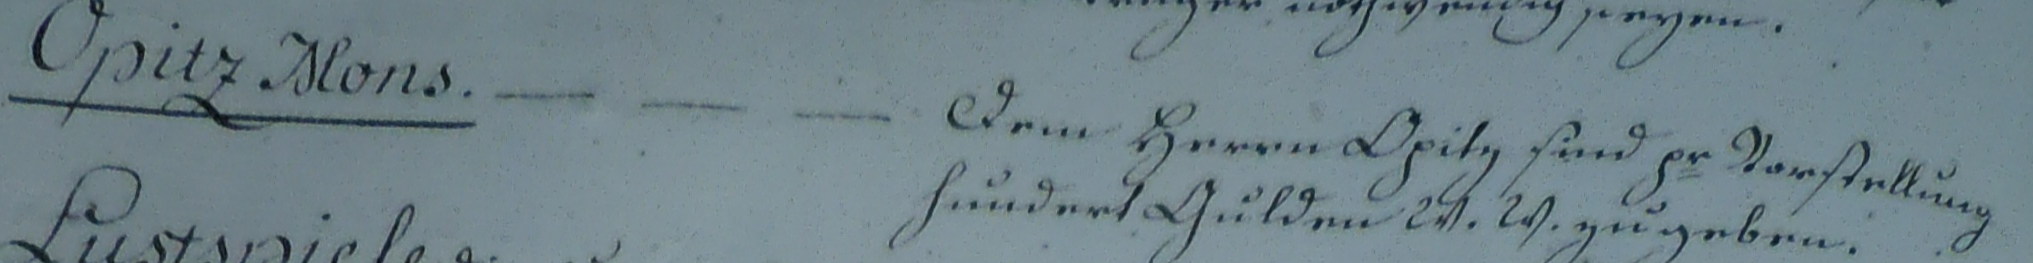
Opitz Mons. _ _ _ Dem Herrn Opitz sind pr Vorstellung
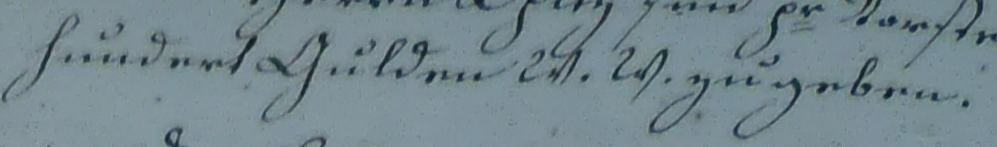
hundert Gulden W.W. zugeben.
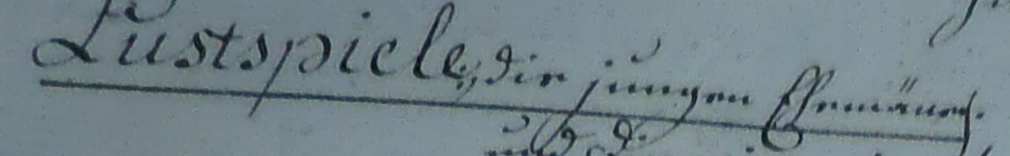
Lustspiele:, die jungen Ehemäner|.
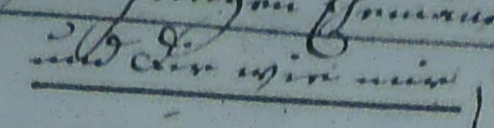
und Dir wie mir |
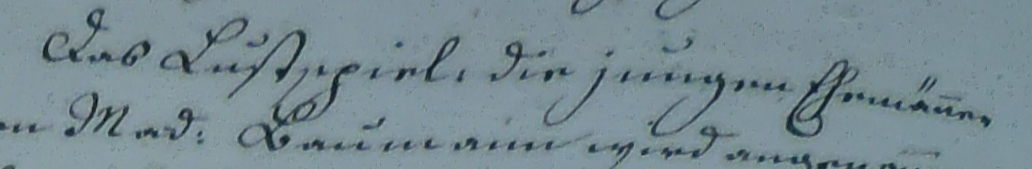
Das Lustspiel: die jungen Ehemäner
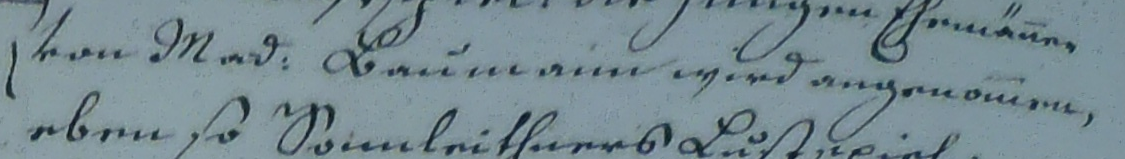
von Mad: Baumann wird angenomen,
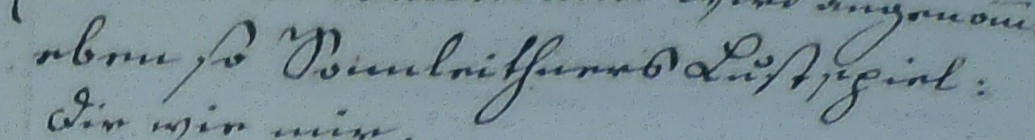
eben so Sonnleithners Lustspiel:
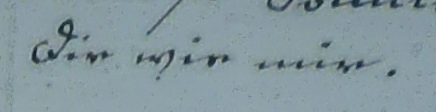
Dir wie mir.
